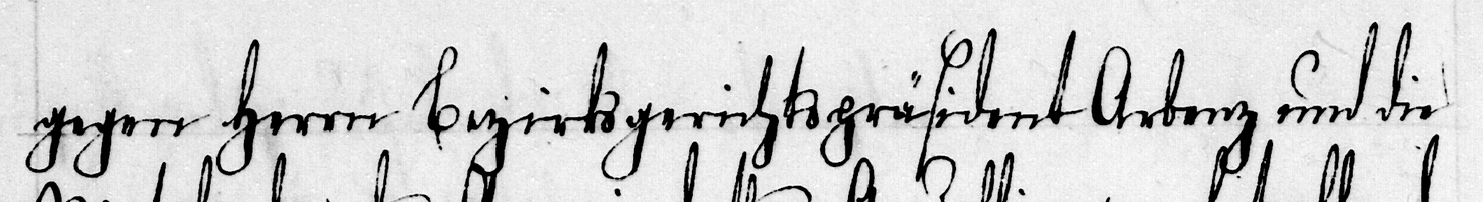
gegen Herrn Bezirksgerichtspräsident Arbenz und die
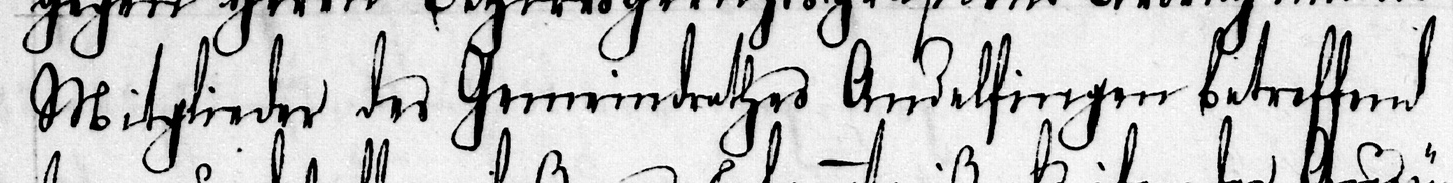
Mitglieder des Gemeindrathes Andelfingen betreffend
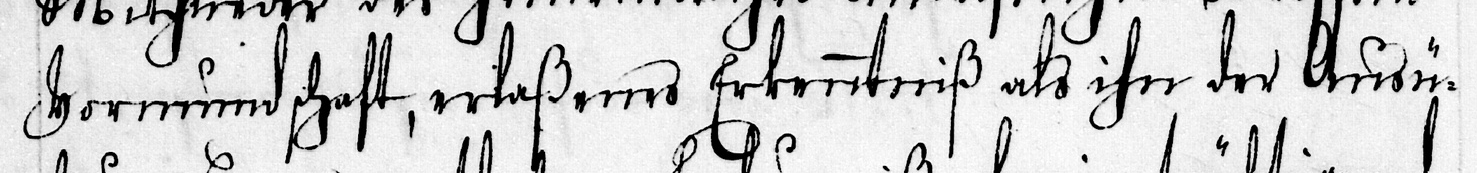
Vormundschaft, erlaßenes Erkenntniß als ihn der Ausü¬
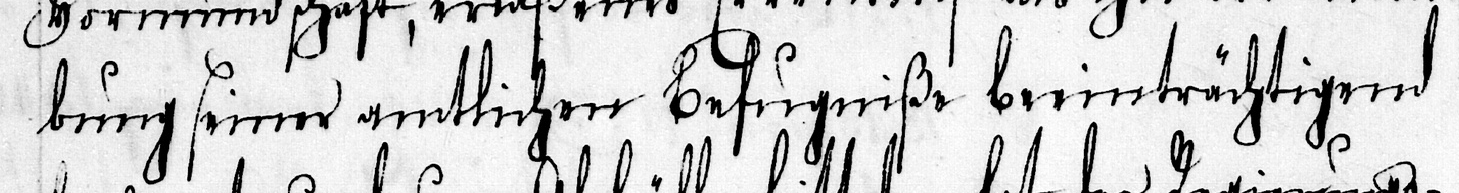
bung seiner amtlichen Befugniße beeinträchtigend
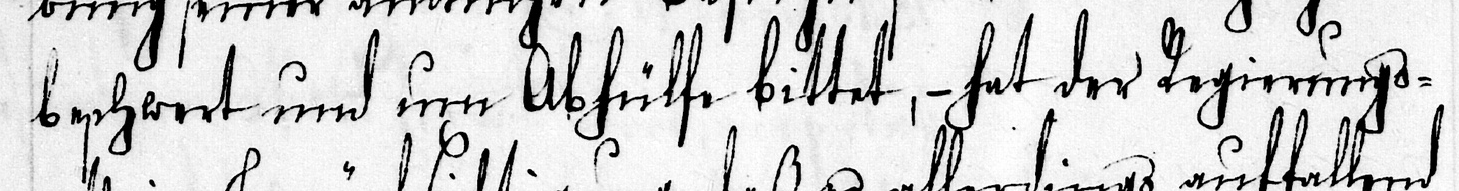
beschwert und um Abhülfe bittet, – hat der Regierungs¬
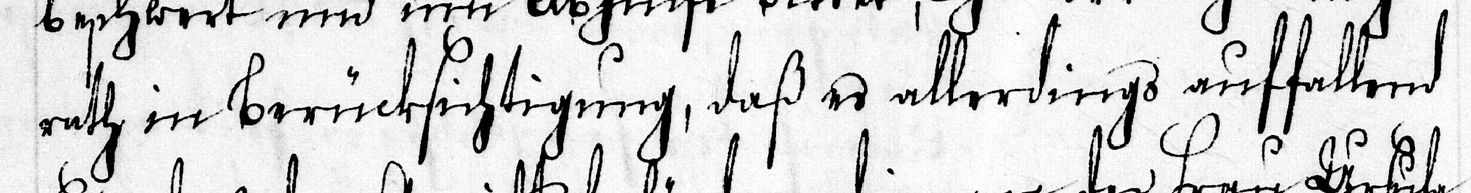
rath in Berücksichtigung, daß es allerdings auffallend
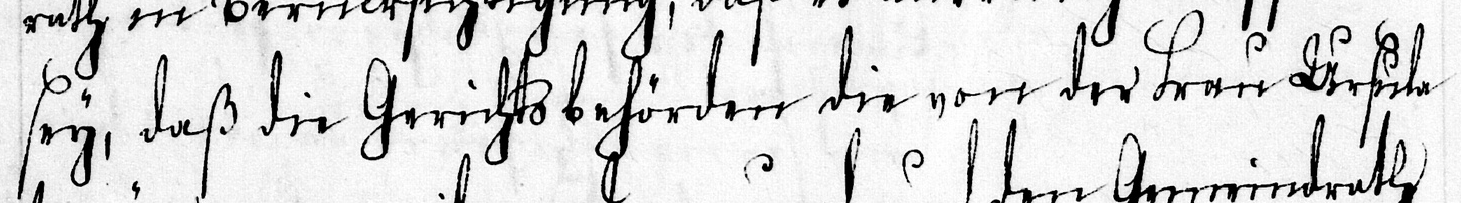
sey, daß die Gerichtsbehörden die von der Frau Ursula
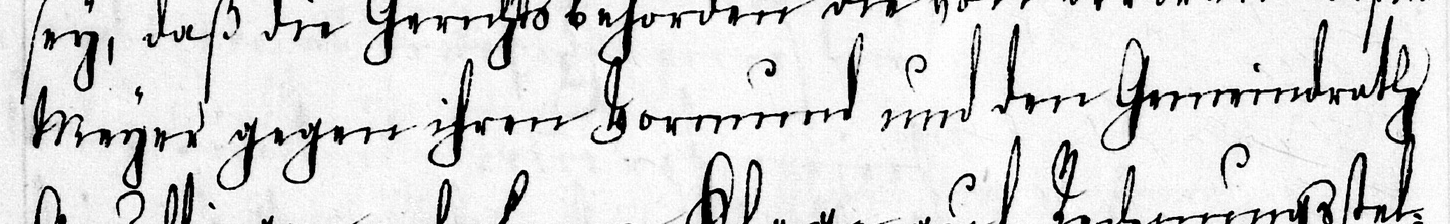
Meyer gegen ihren Vormund und den Gemeindrath
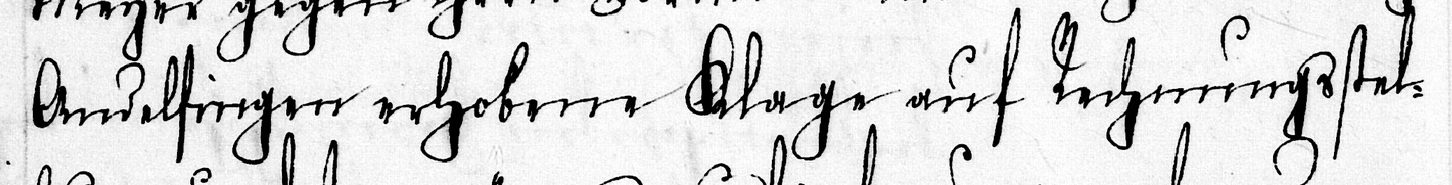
Andelfingen erhobene Klage auf Rechnungsstel¬
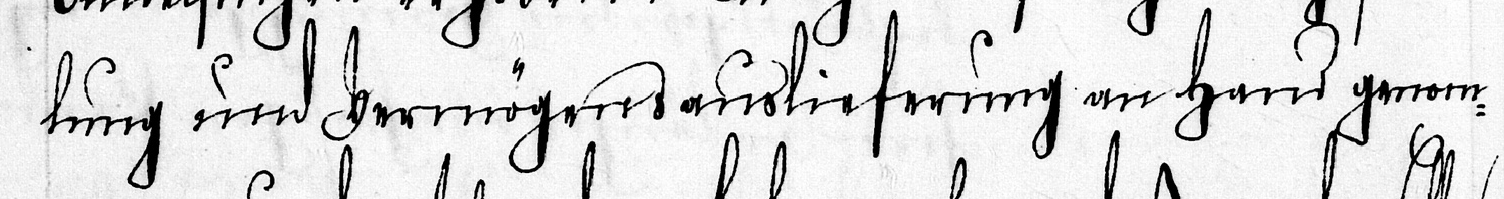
lung und Vermögensauslieferung an Hand genom¬
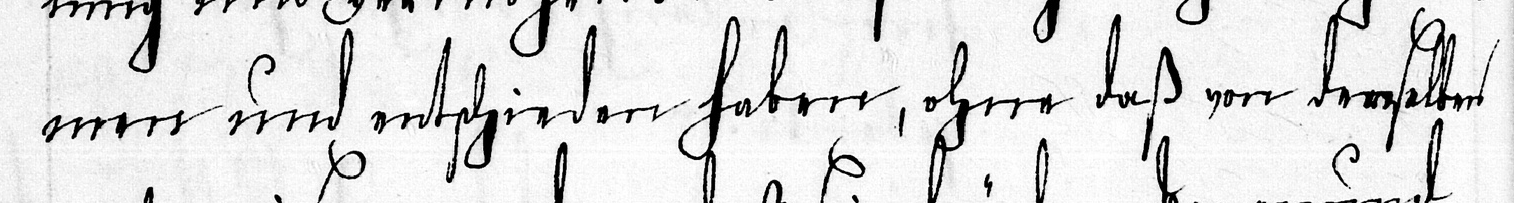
men und entschieden haben, ohne daß von derselben
